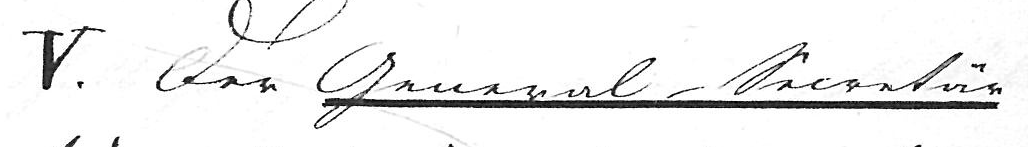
V. Der General-Secretär
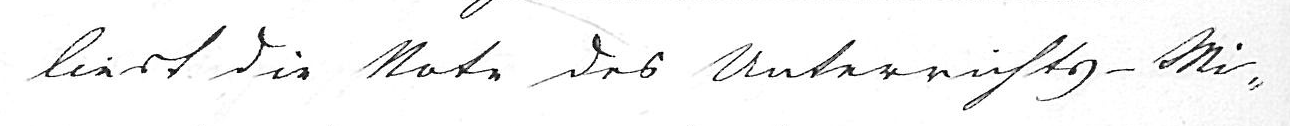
liest die Noten des Unterrichts-Mi-
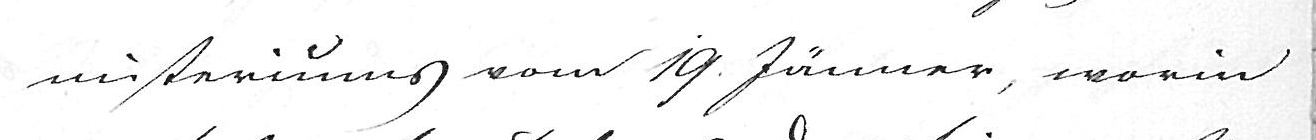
nisteriums vom 19. Jänner, worin
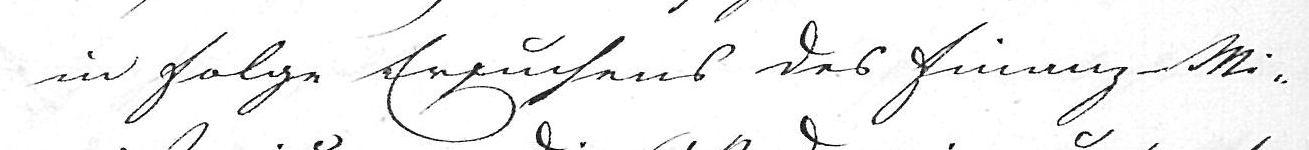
in Folge Ersuchens des Finanz-Mi-
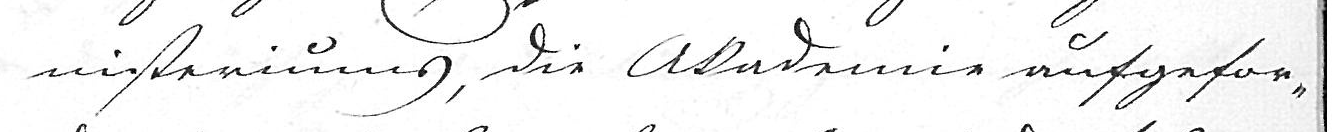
nisteriums, die Akademie aufgefor-
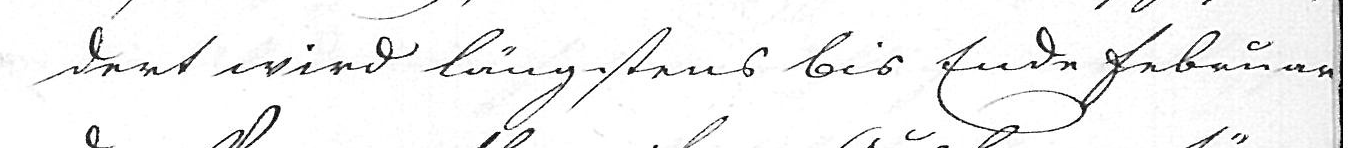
der wird längstens bis Ende Februar
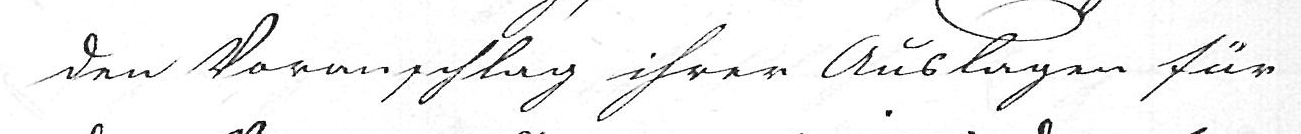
den Voranschlag ihrer Auslagen für
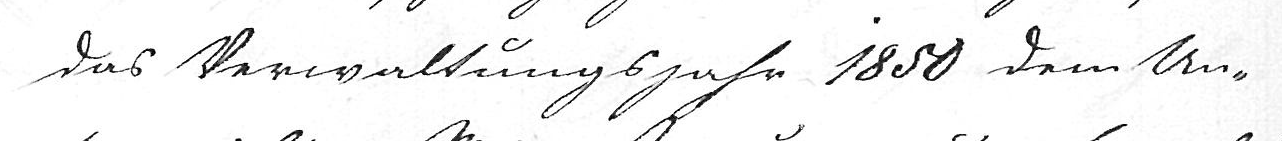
das Verwaltungsjahr 1850 dem Un-
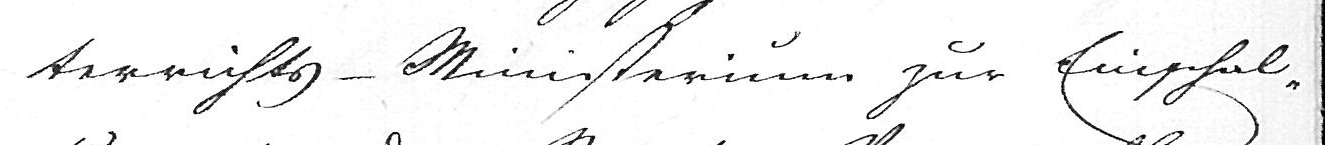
terrichts-Ministerium zur Einschal-
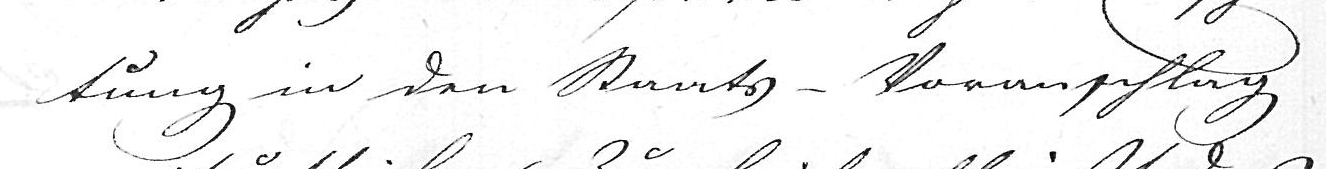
tung in den Staats-Voranschlag
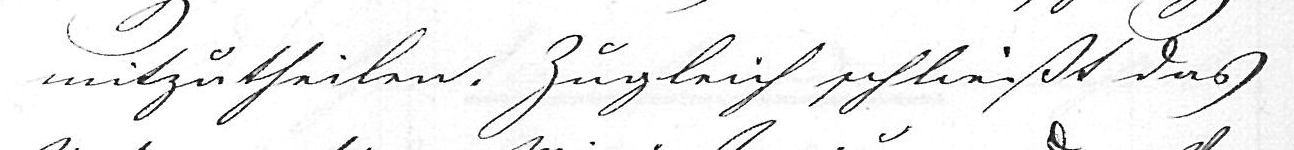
mitzutheilen. Zugleich schließt das
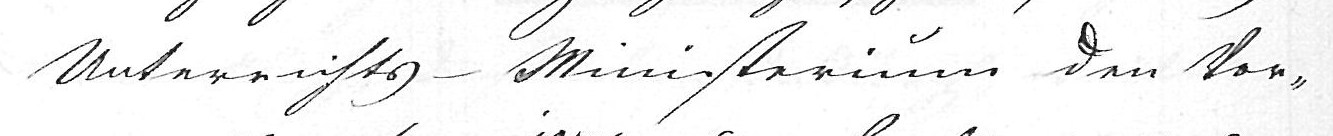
Unterrichts-Ministerium den Vor-
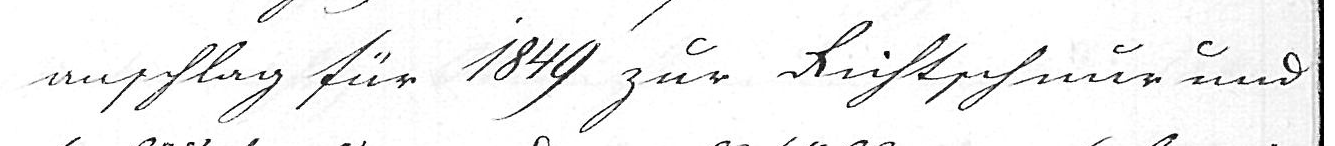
anschlag für 1849 zur Richtschnur und
